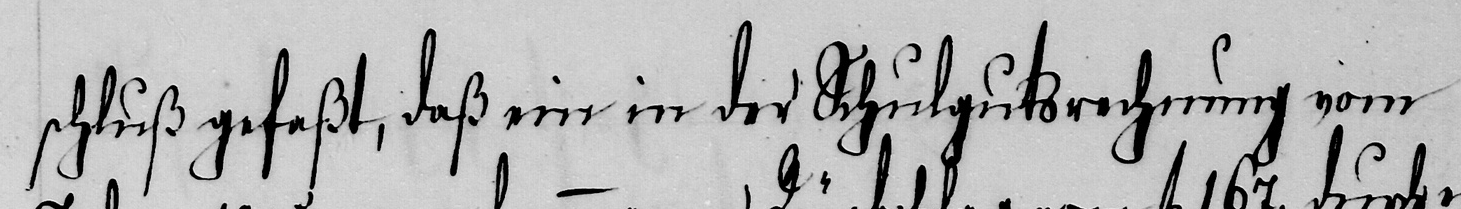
schluß gefaßt, daß ein in der Schulgutsrechnung vom
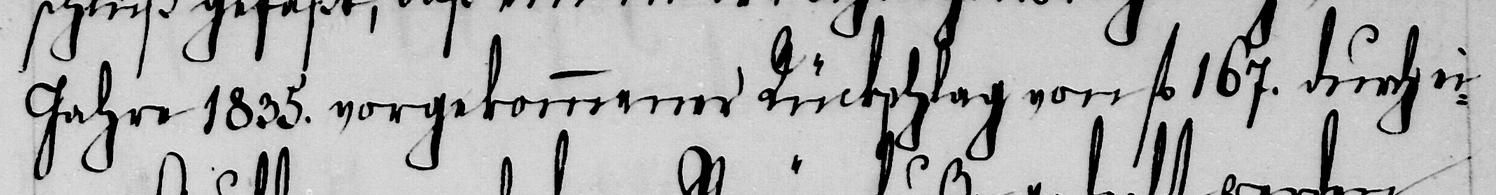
Jahre 1835. vorgekommener Rückschlag von fl. 167. durch ei¬
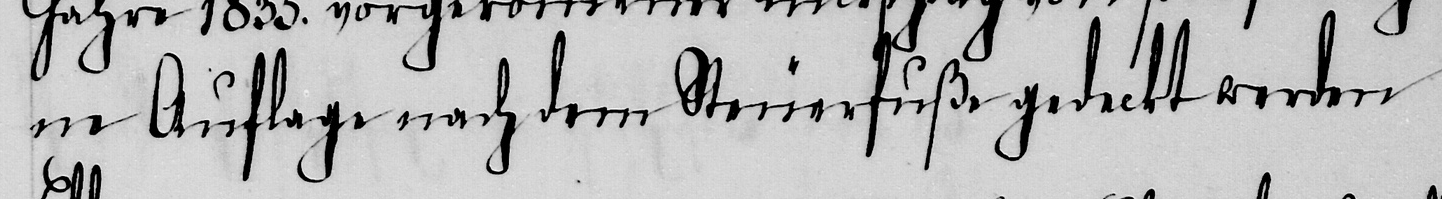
ne Auflage nach dem Steuerfuße gedeckt werden
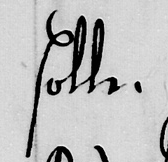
lla¬
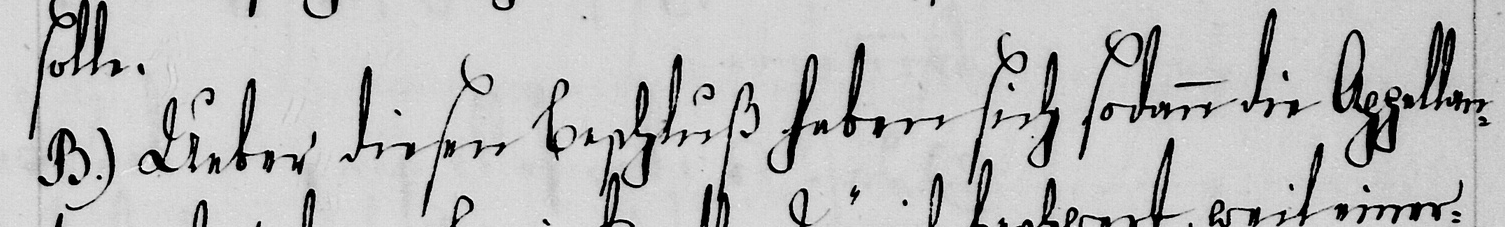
B.) Ueber diesen Beschluß haben sich sodann die Appe¬
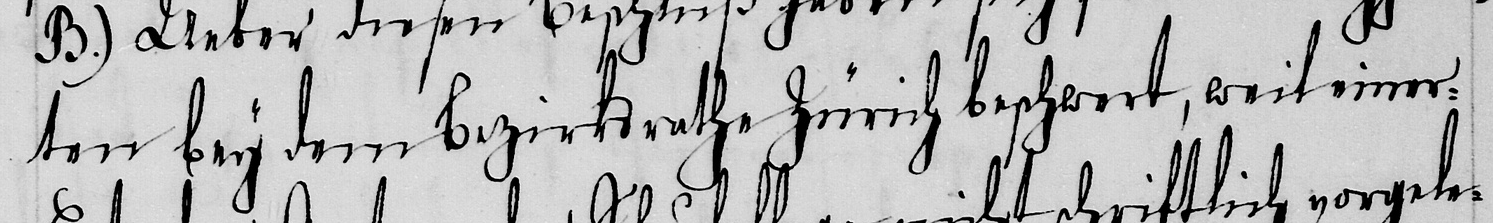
nten bey dem Bezirksrathe Zürich beschwert, weil einer¬
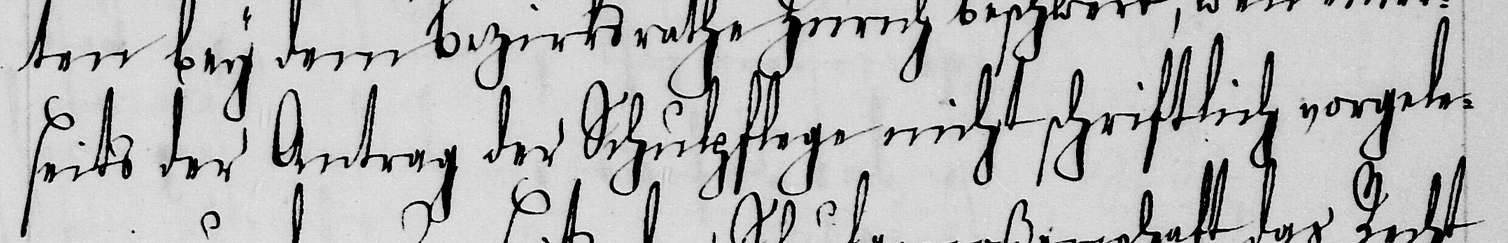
seits der Antrag der Schulpflege nicht schriftlich vorgel¬
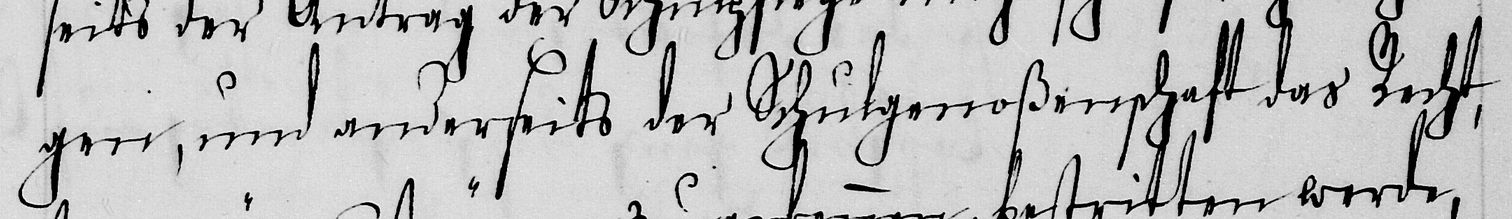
egen, und anderseits der Schulgenoßenschaft das Recht,
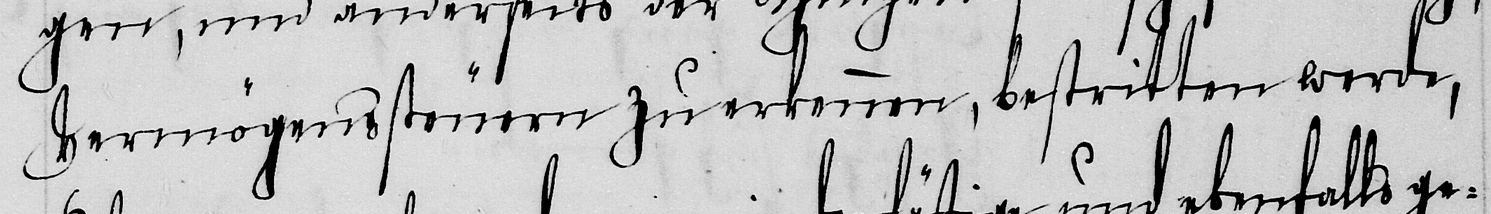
Vermögenssteuern zu erkennen, bestritten werde,
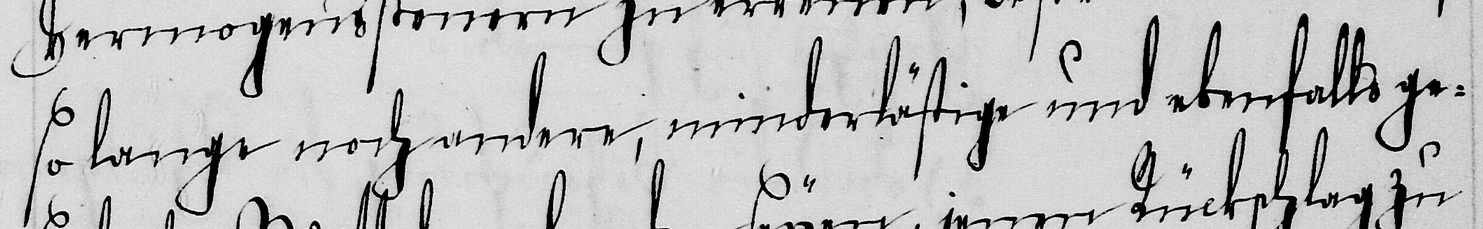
so lange noch andere, minderlästige und ebenfalls ge¬
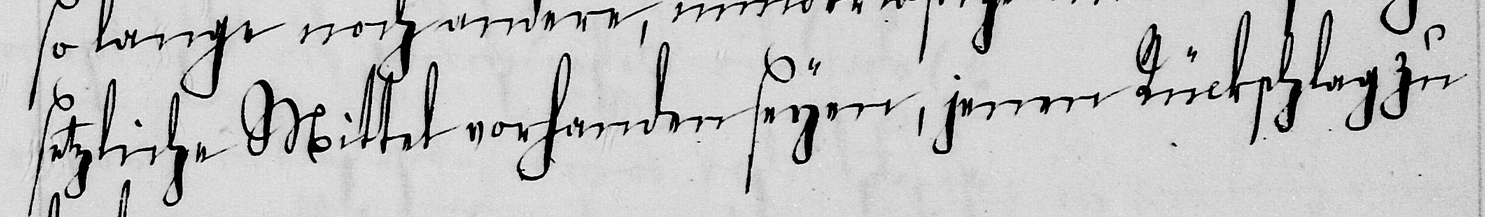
setzliche Mittel vorhanden seyen, jenen Rückschlag zu
